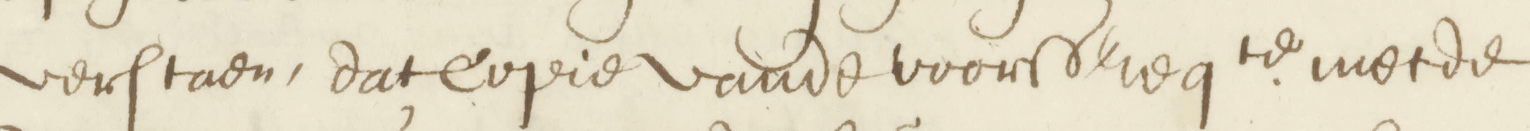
verstaen, dat copie vande voors. reqte. met de
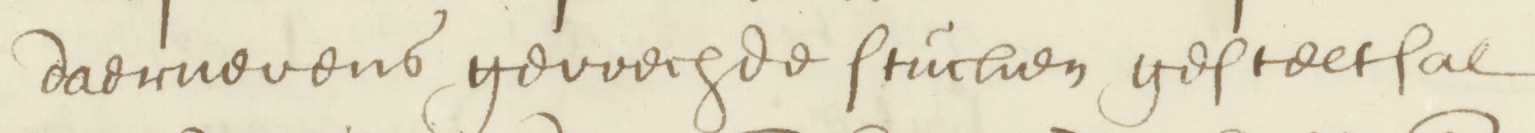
daernevens gevoechde stucken gestelt sal
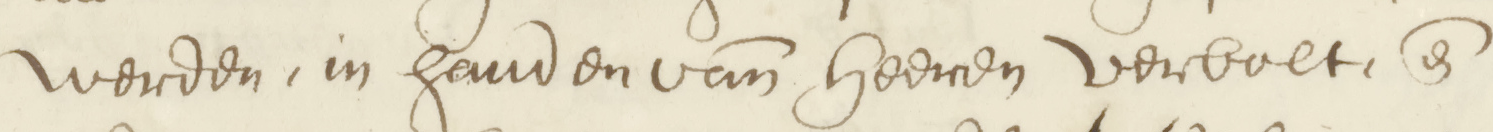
werden, in handen van heeren verbolt, &
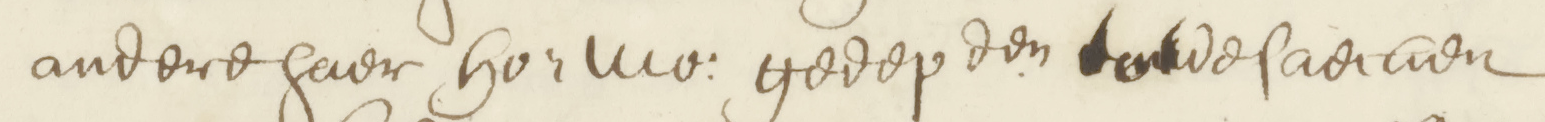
andere haer ho:mo: gedepden tot de saecken
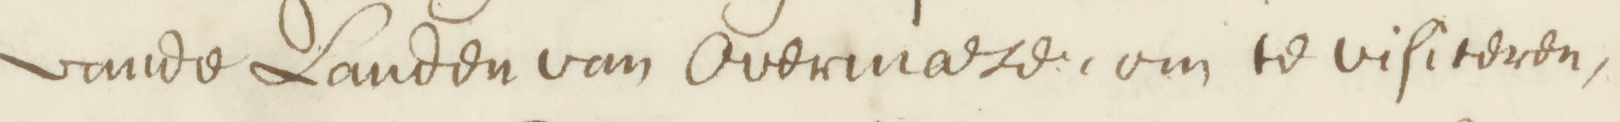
vande Landen van Overmaze, om te visiteren,
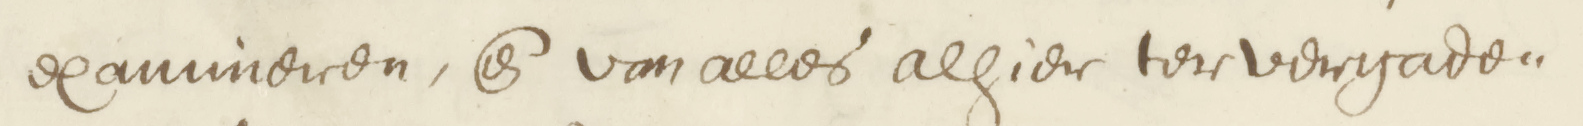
examineren, & van alles alhier ter vergade„
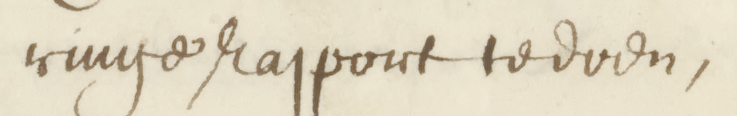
ringe rapport te doen.
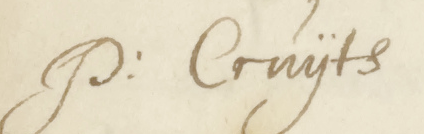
P: Cruijts
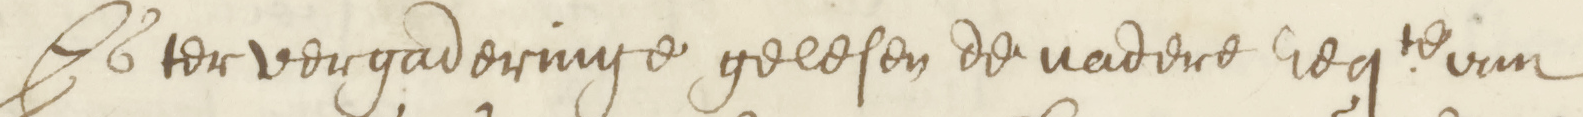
Is ter vergaderinge gelesen de nadere reqte van
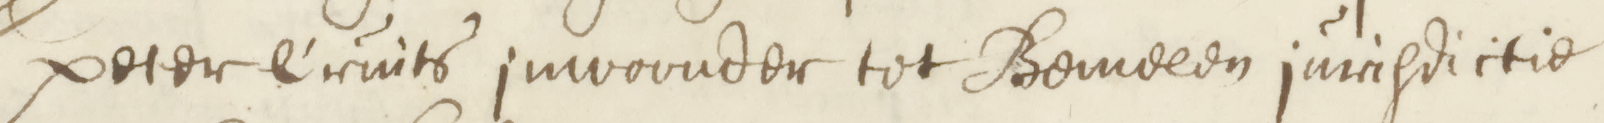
peter Cruits inwoonder tot Bemelen jurisdictie
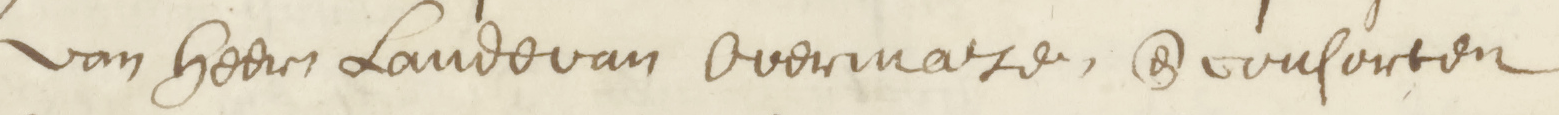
van heer Lande van Overmaze, & consorten
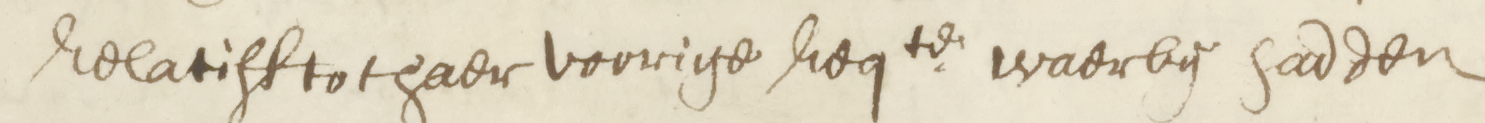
relatiff tot haer voorige reqte. waerbij hadden
